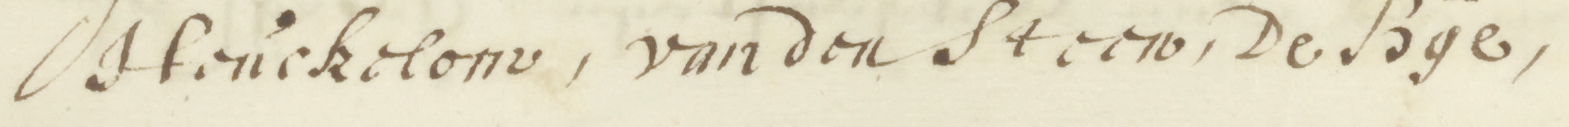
Heuckelom, vanden Steen, de Bije,
